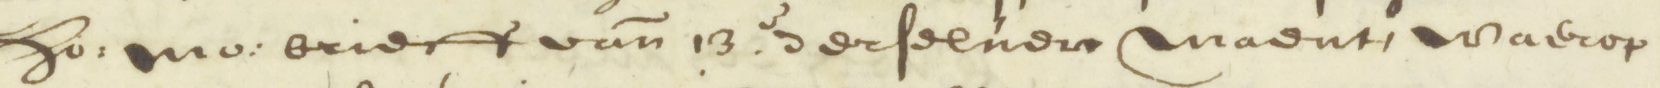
Ho:mo: brieff van 13e derselver maent, Waerop
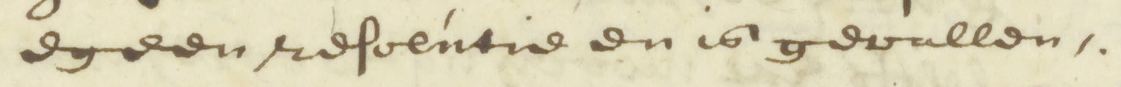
egeen resolutie en is gevallen.
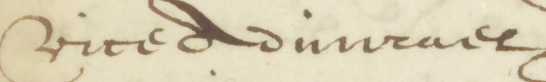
Vice Admirael
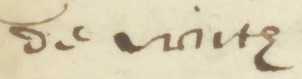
de With
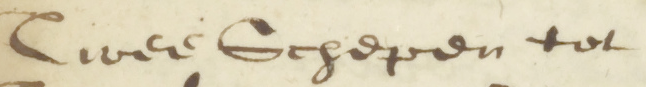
Twee Schepen tot
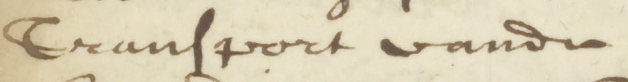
Transport vanden
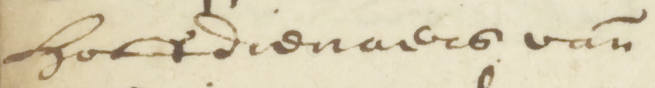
Hoffdienaers van
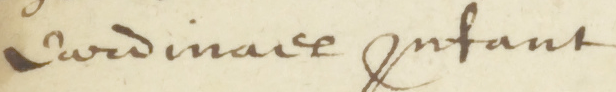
Cardinael Infant
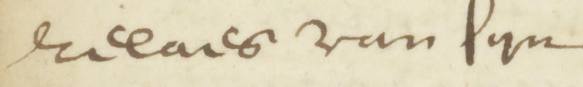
relaes van syn
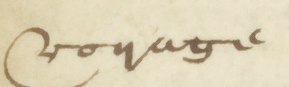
voyage
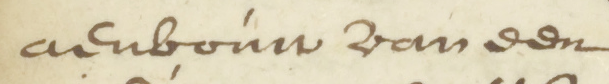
aenbouw van een
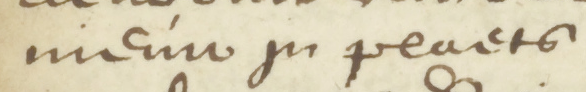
nieuw in plaets
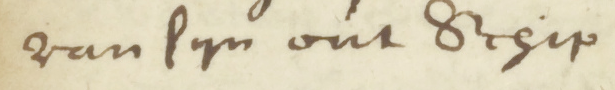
van syn out Schip
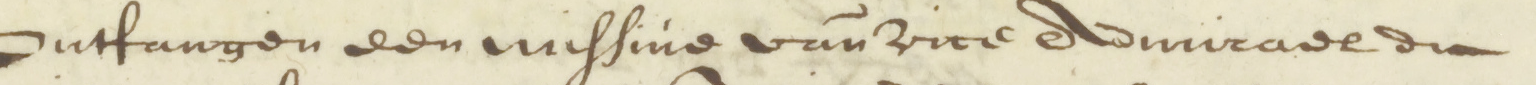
Ontfangen een missive van vice Admirael de
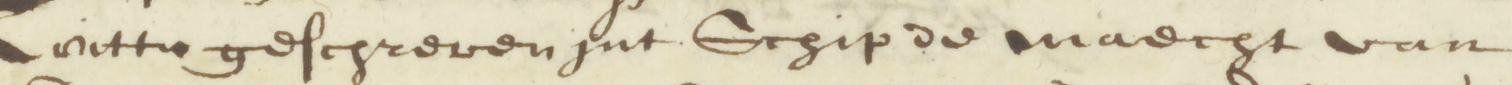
Witte geschreven int Schip de Maecht van
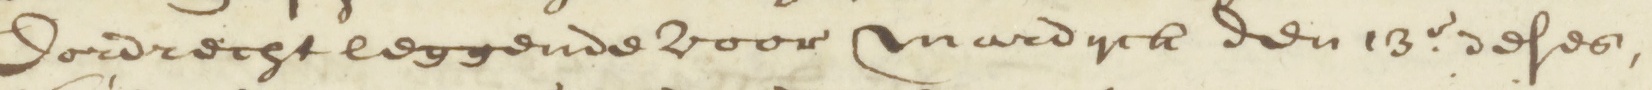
Dordrecht leggende voor Mardyck den 13e deses,
